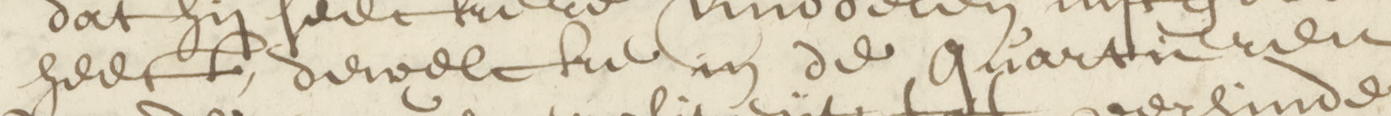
heeft, dewelcke in de Quartieren
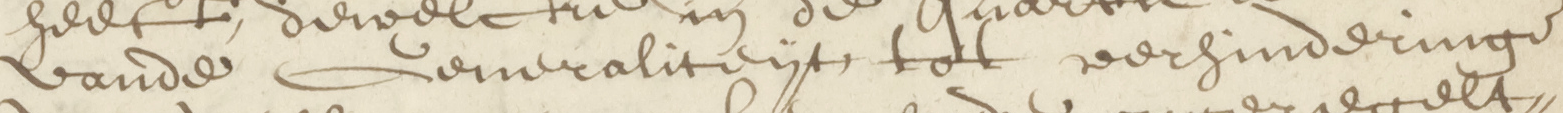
vande Generaliteijt, tot verhinderinge
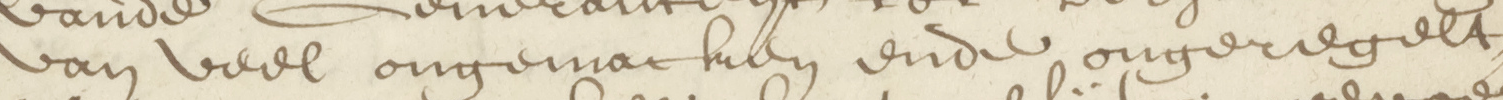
van veel ongemacken ende ongeregelt„
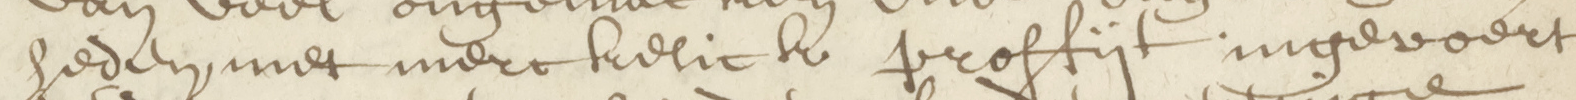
heden, met merckelick proffijt ingevoert
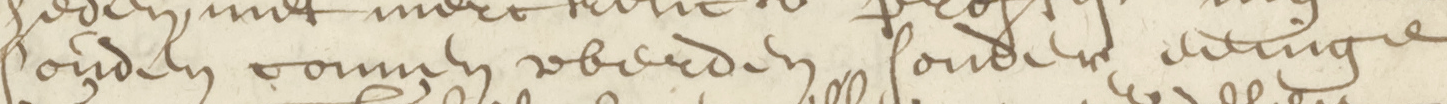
souden connen werden sonder eenige
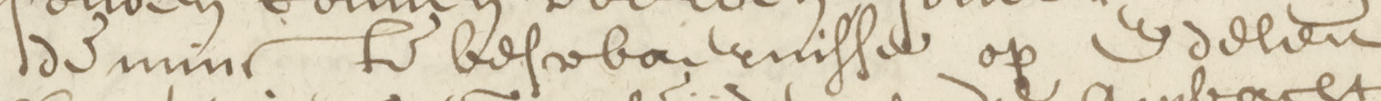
de minste beswaernisse op Edelen,
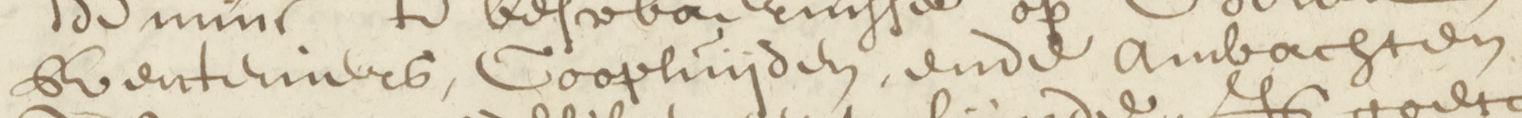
Renteniers, Coopluijden, ende Ambachten.
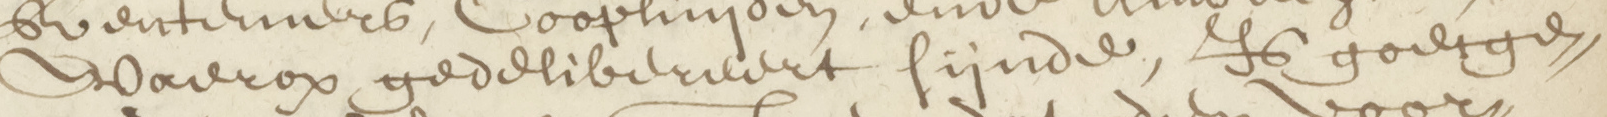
Waerop gedelibereert sijnde, Is goetge„
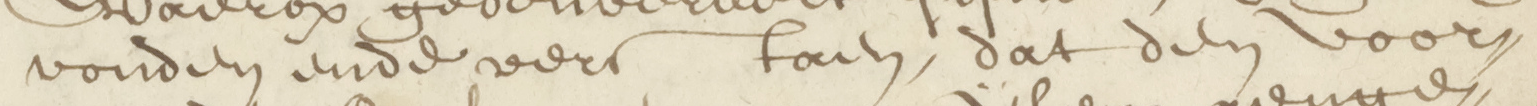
vonden ende verstaen, dat den voor„
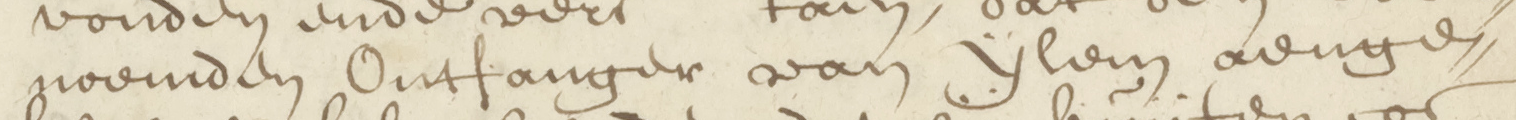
noemden Ontfanger van Ylem aenge„
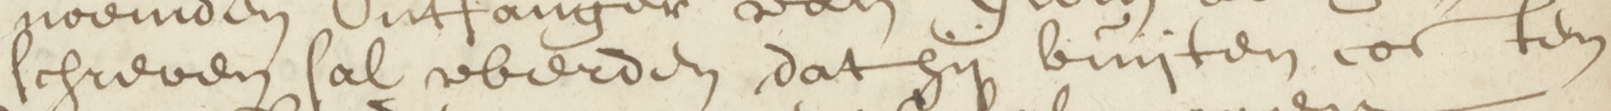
schreven sal werden, dat hij buijten costen
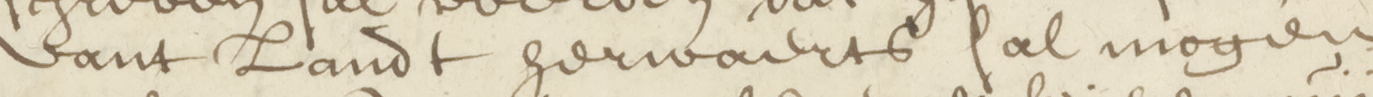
vant Landt herwaerts sal mogen
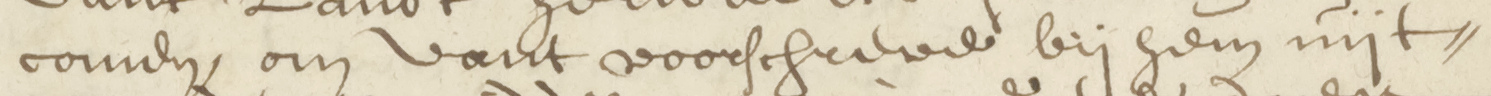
comen, om vant voorschreve bij hem uijt„
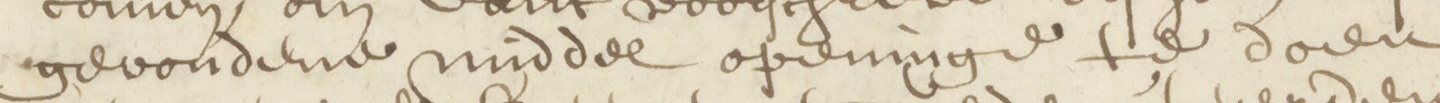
gevondene middel openinge te doen
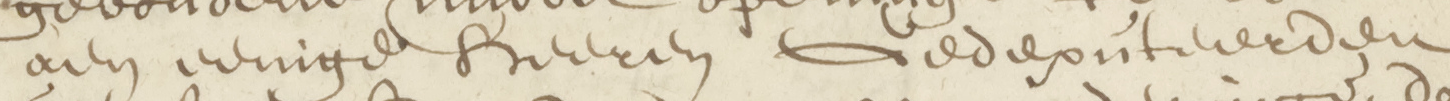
aen eenige Heeren Gedeputeerden
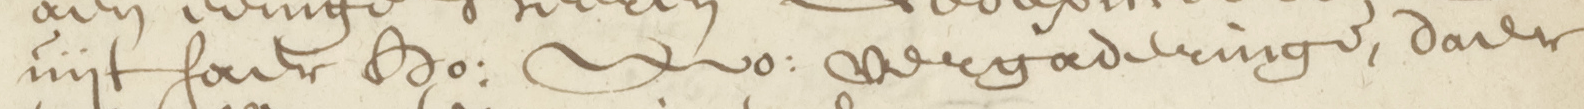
uijt haer Ho:Mo: Vergaderinge, daer
